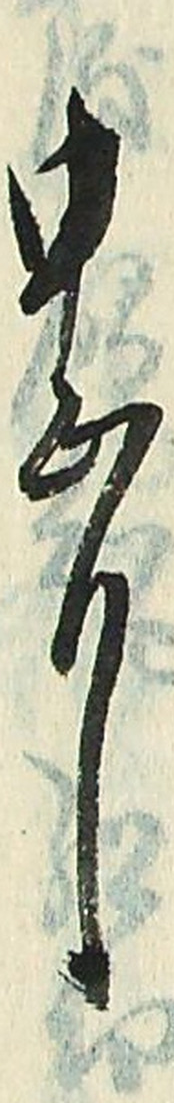申正月
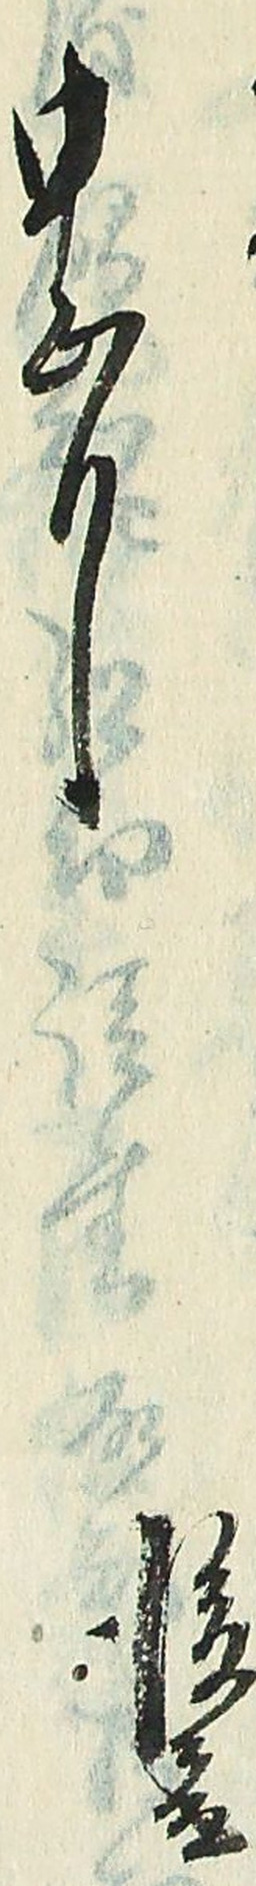申正月

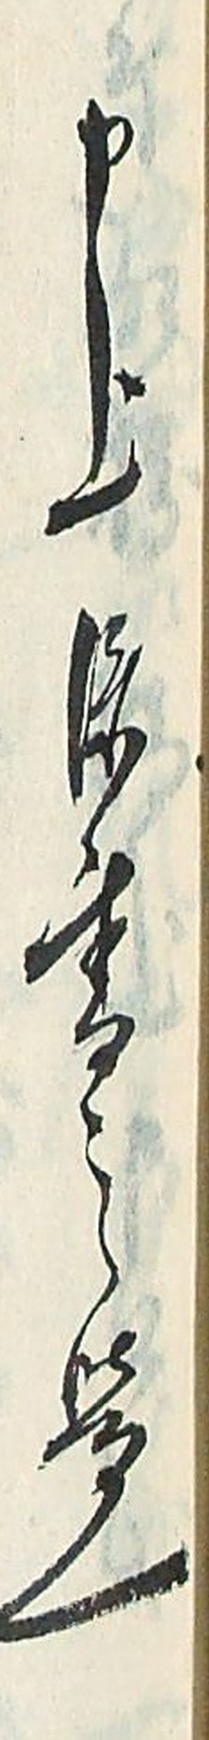申上添書之覚
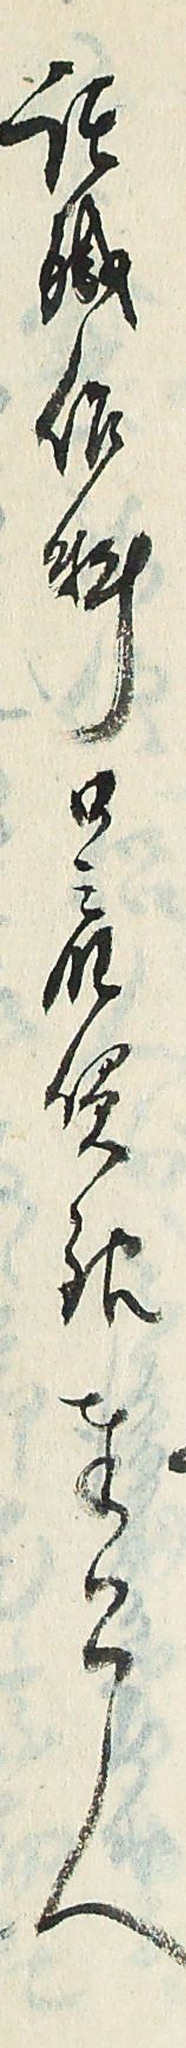諸職作料日雇賃金奉公人
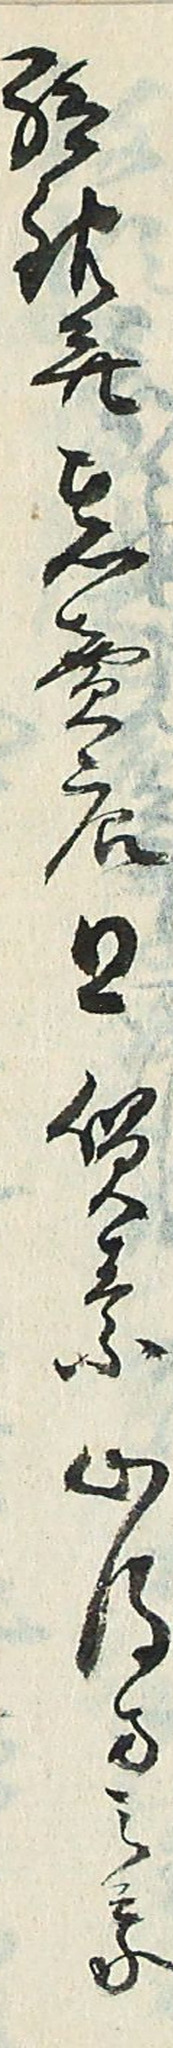給銀幷煮売店且質素心得方之義
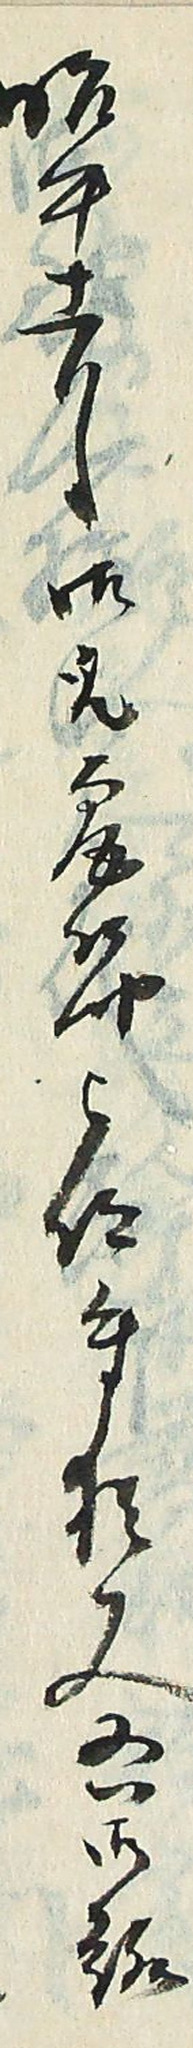昨午十一月御取究筋被仰付猶又右御趣
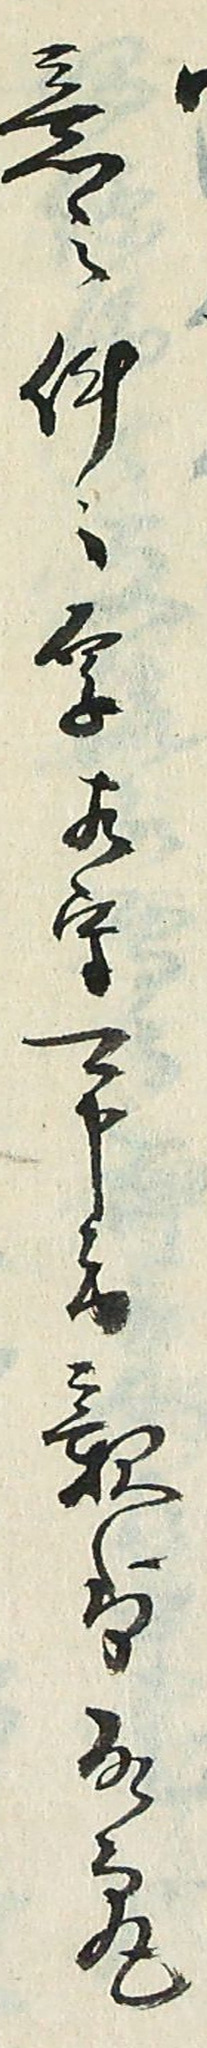意の件々厚相守可申旨親布取究
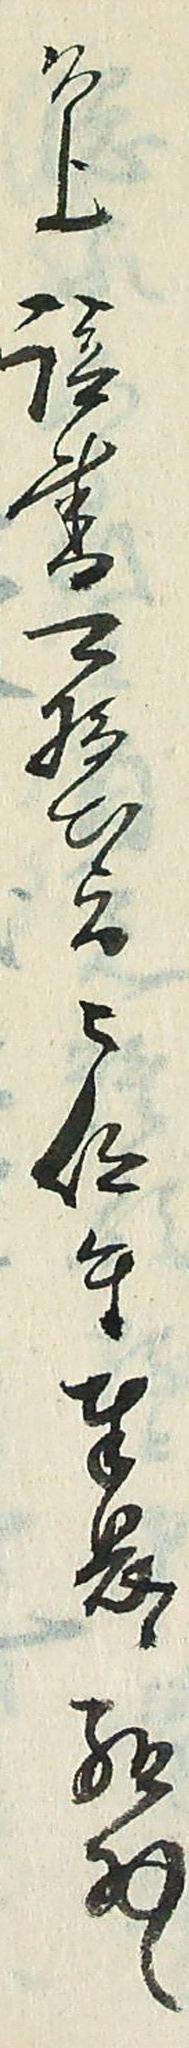候上請書可指出旨被仰付奉畏候組村へ
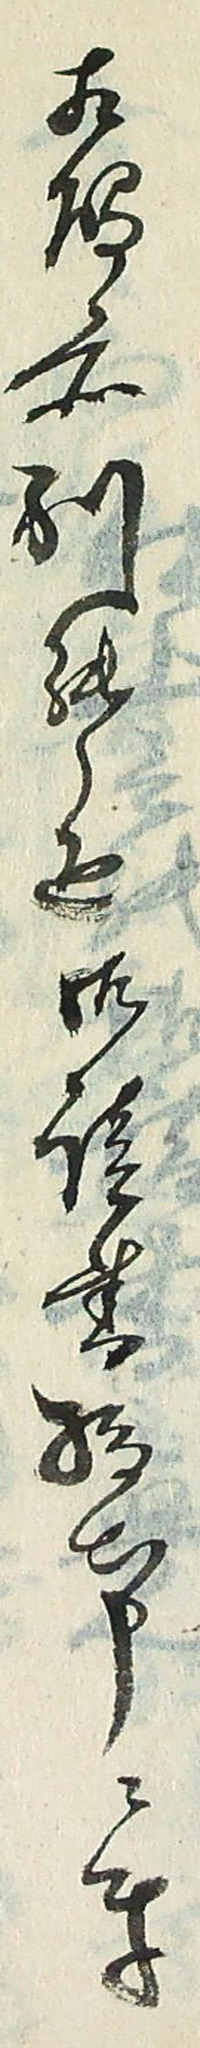相触候所別紙之通御請書指出申に付
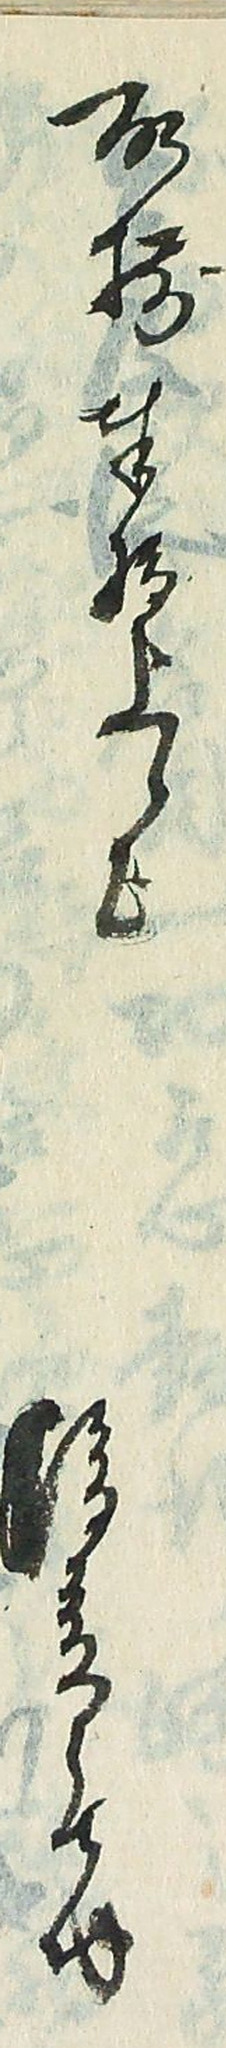取揃奉指上候以上
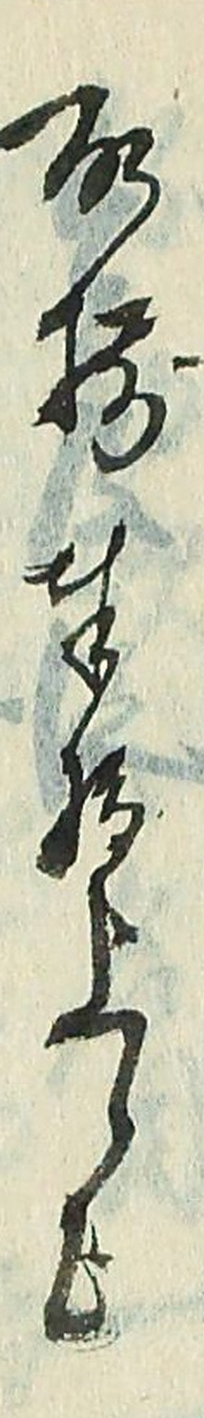取揃奉指上候以上
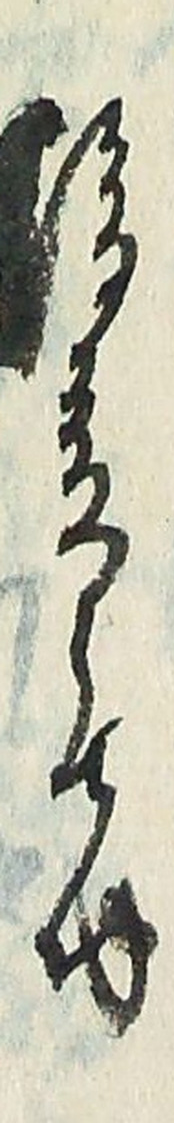後藤庄助
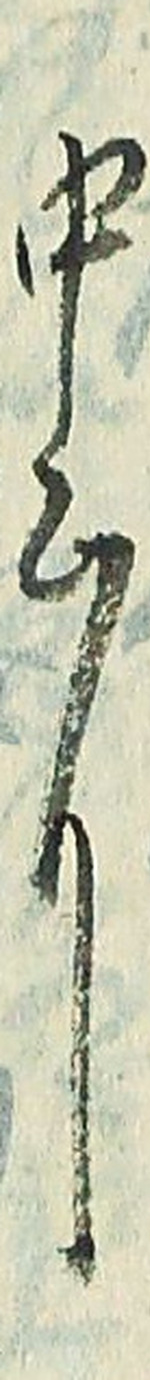申正月
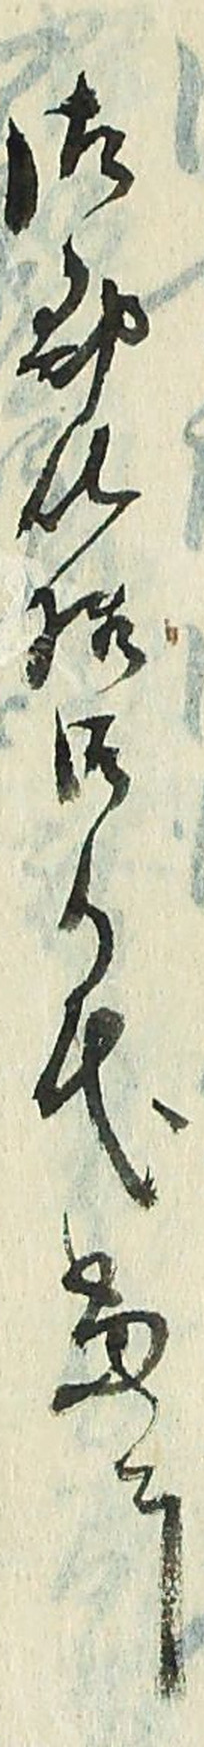御郡代様御手代当て
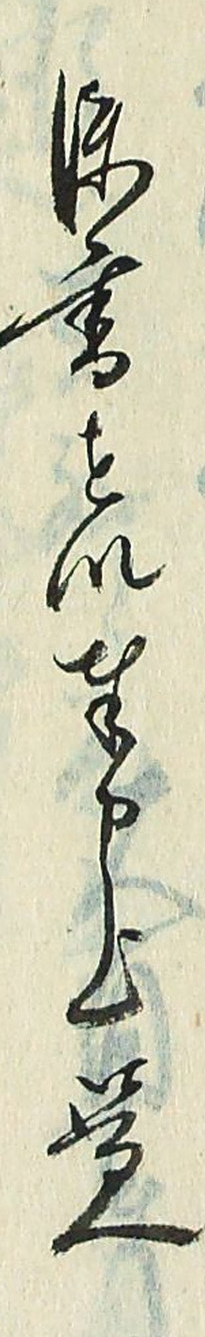添書を以奉申上覚
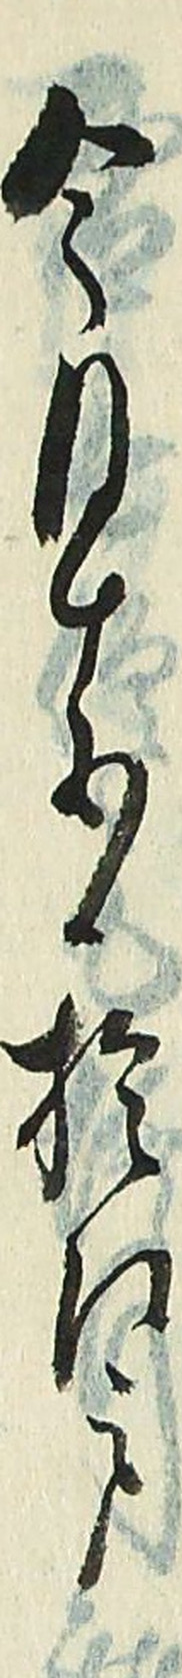今月十五日於江戸
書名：諸御用御□受書控
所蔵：鳴門教育大学 Naruto University of Education
